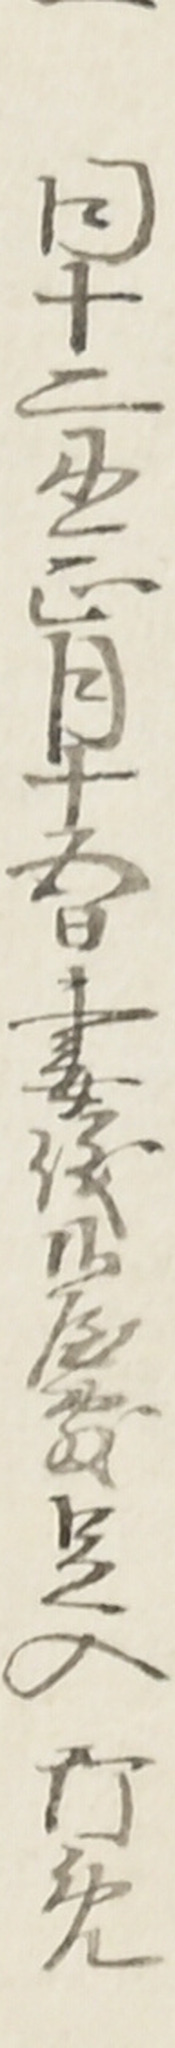一同十二丑正月十五日妻儀御屋敷足入御免
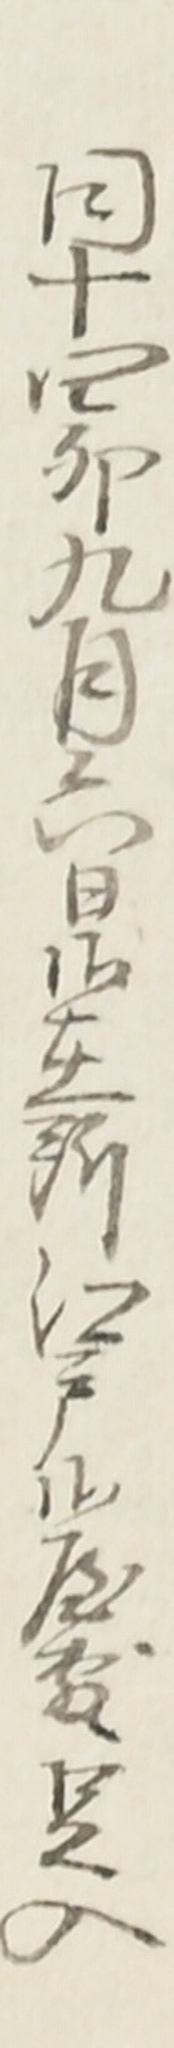一同十四卯九月六日御在所江戸御屋敷足入
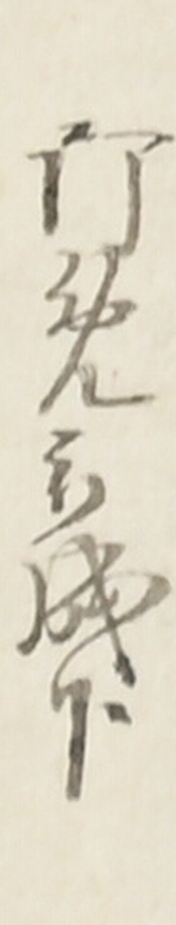御免被成下

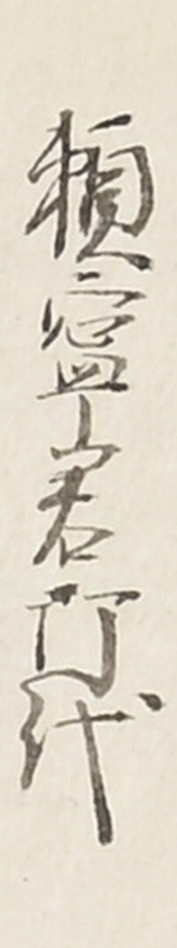頼寧君御代
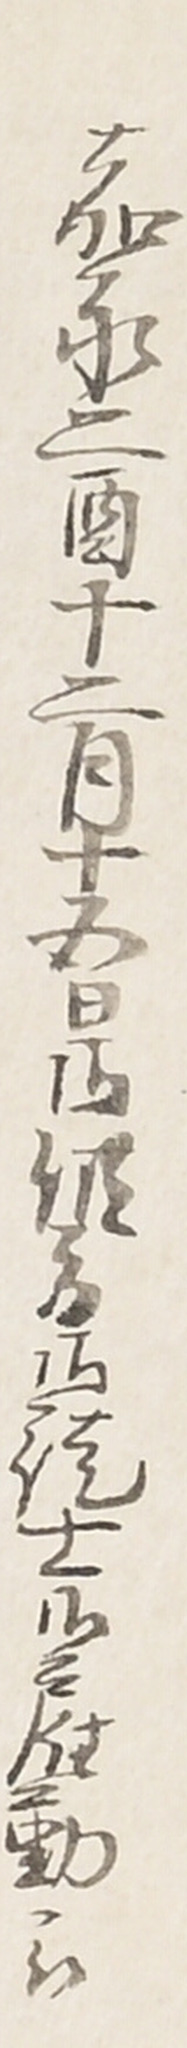一嘉永二酉十二月十五日御供方御徒士御雇勤被
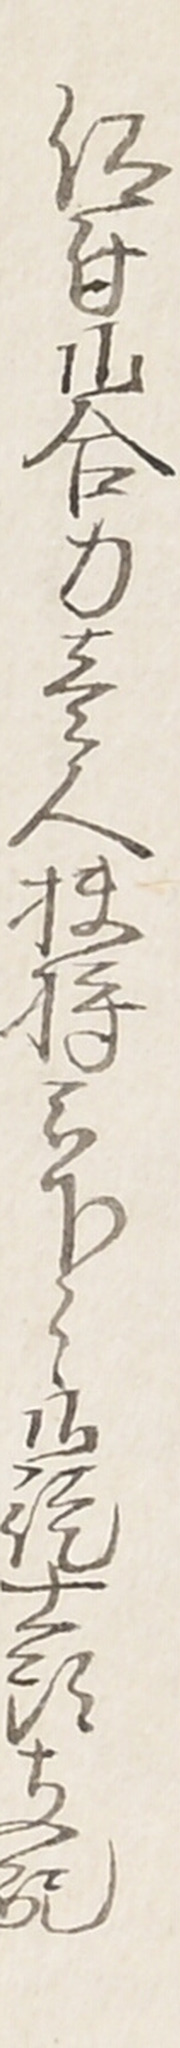仰付御合力壱人扶持被下之御徒士頭支配
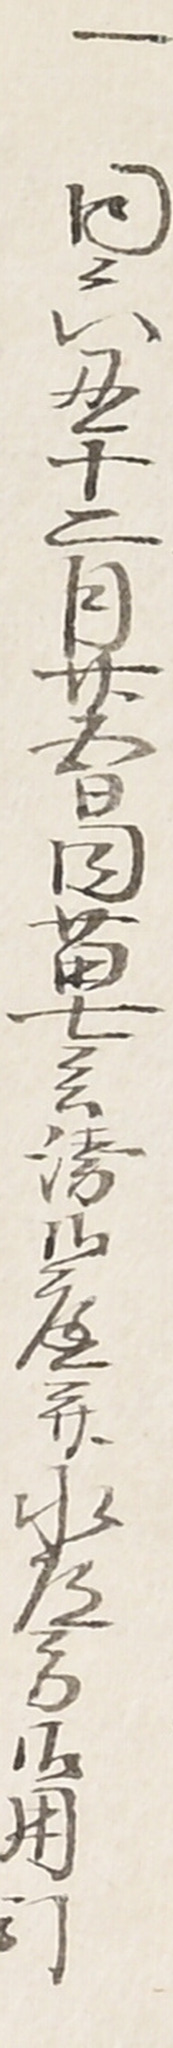一同六丑十二月廿五日同苗七兵衛御庭并水道方御用引
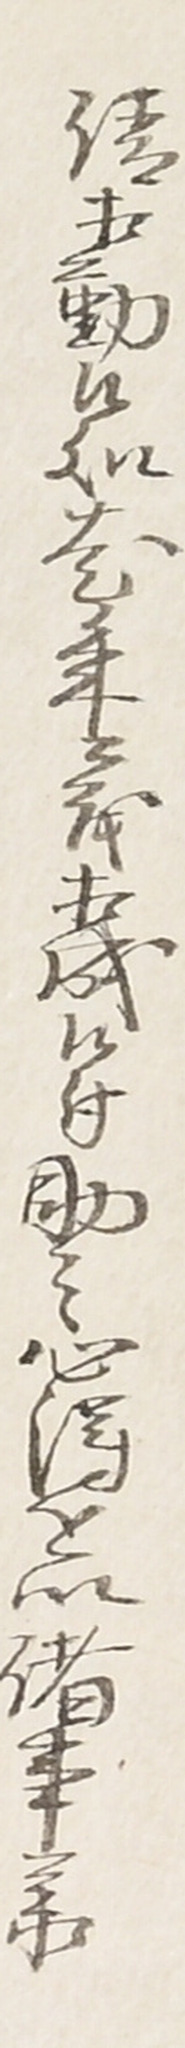請相勤候処老年ニ茂相成候付助之心得を以諸事承
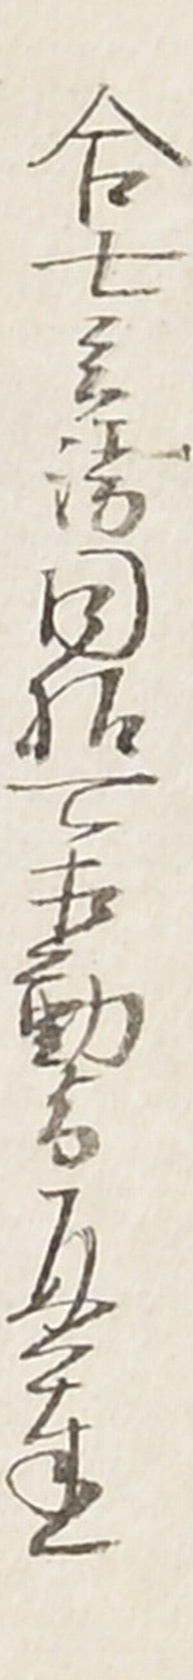合七兵衛同様可相勤旨通達
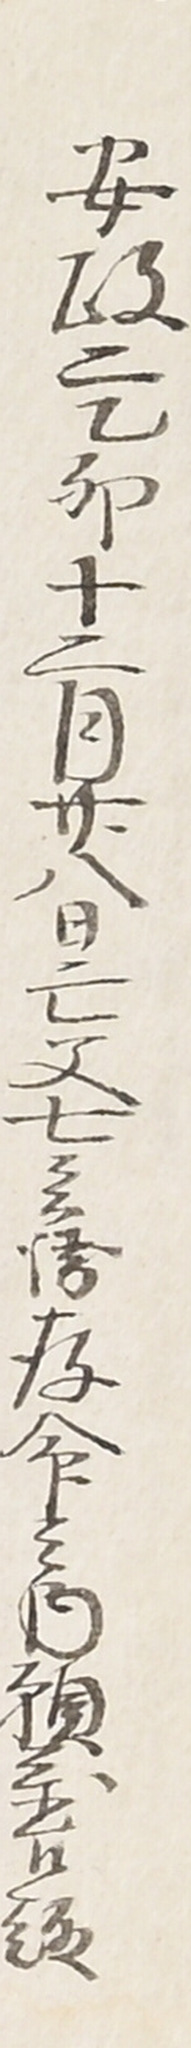一安政二乙卯十二月廿八日亡父七兵衛存命之内願置候趣
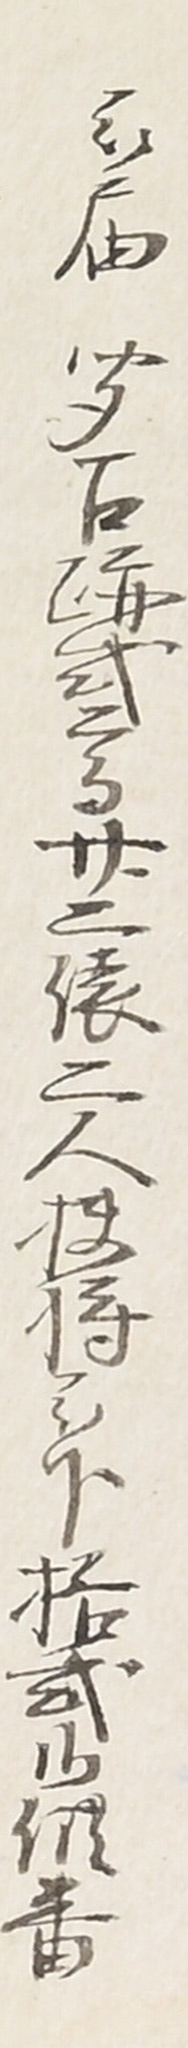被届聞召跡式高廿二俵二人扶持被下格式御供番
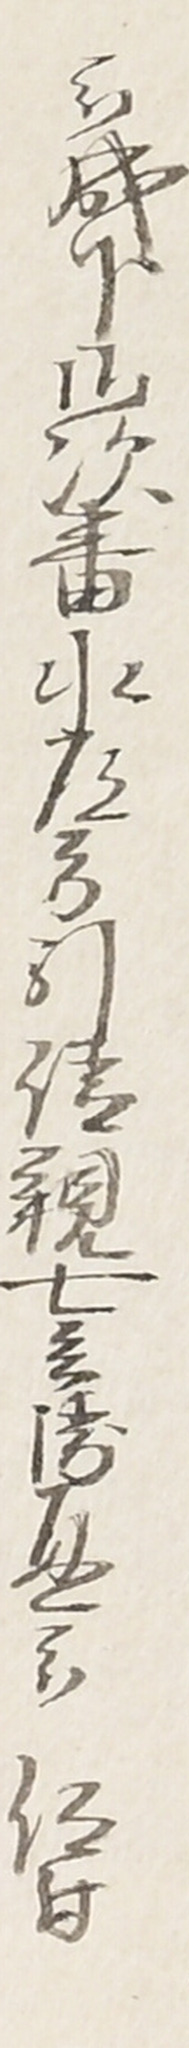被成下御次番水道方引請親七兵衛通被仰付

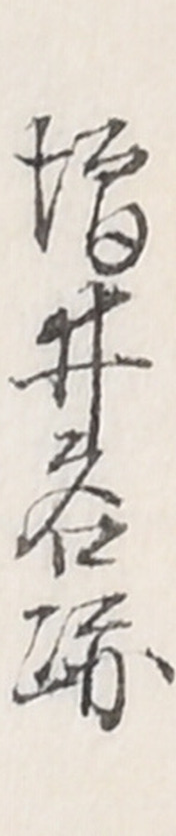増井名跡
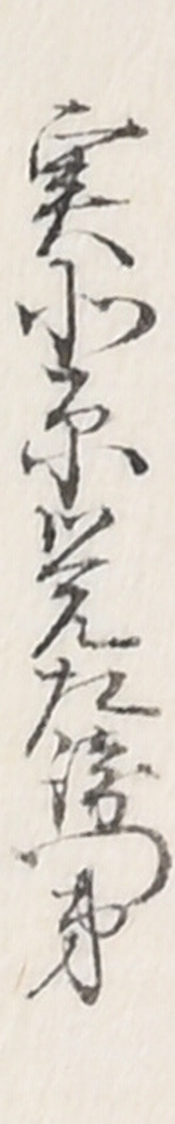実北原覚左衛門弟
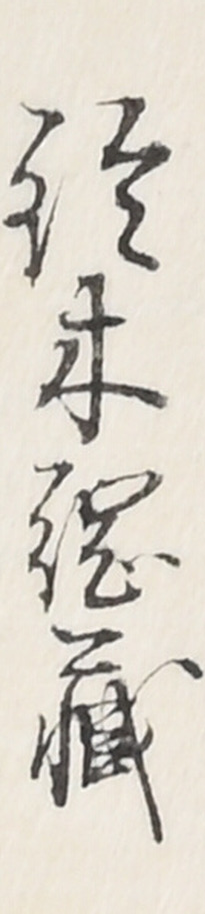鈴木鋼蔵
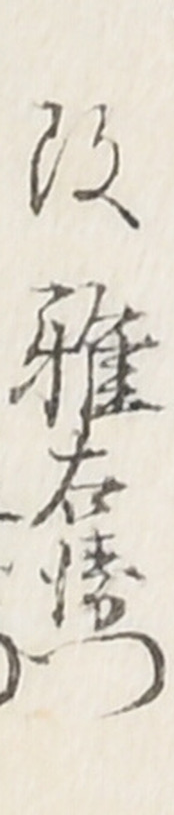改雅右衛門
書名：無足諸士勤仕録（四）
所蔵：伊那市立高遠町図書館・合同会社AMANE
